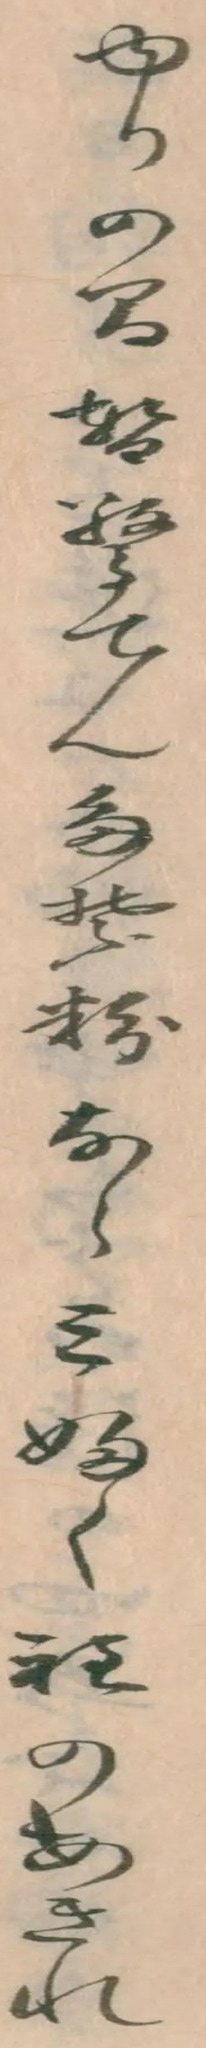ゆりの間暫驚てんたは粉なら三ふく程のあきれ
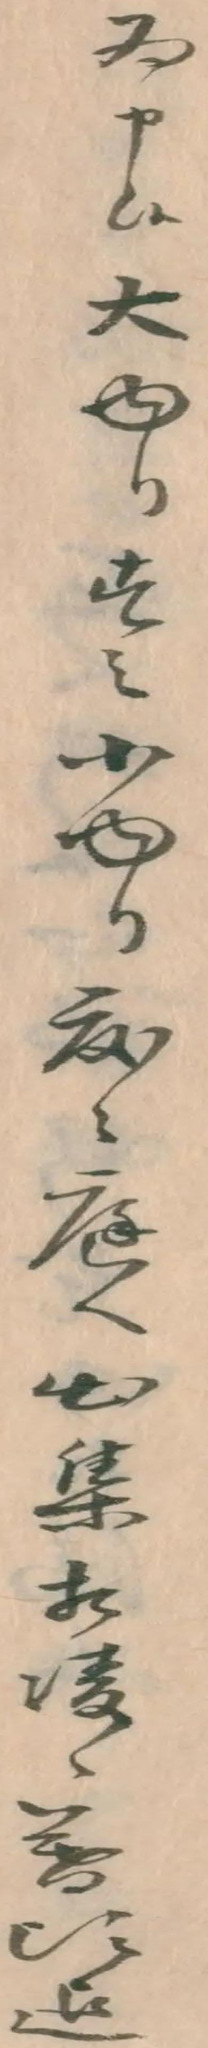ゐ申候大ゆりすミ小ゆり度々庭へ出集相凌候暮頃迄
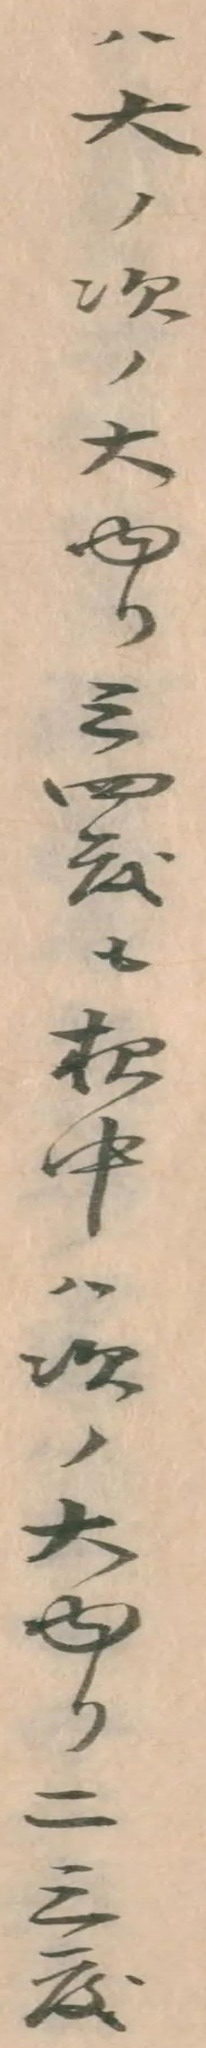ハ大ノ次ノ大ゆり三四度も夜中ハ次ノ大ゆり二三度
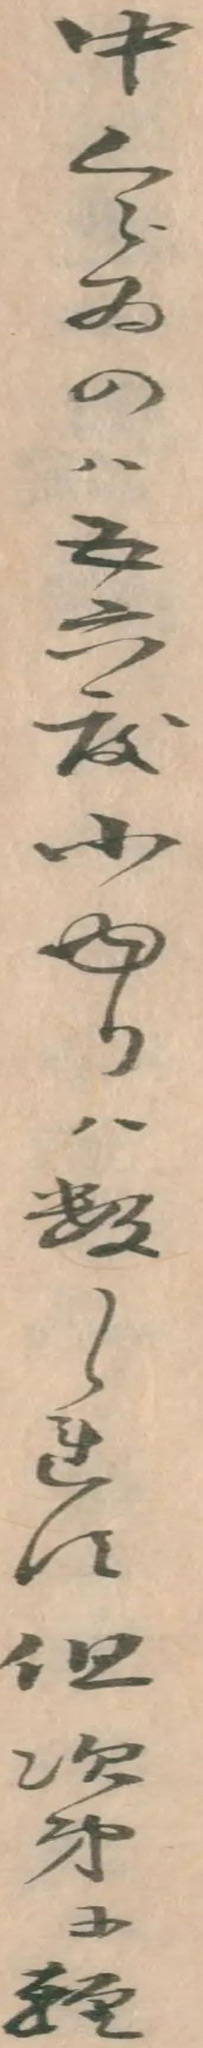中くらゐのハ五六度小ゆりハ数しれす但次第に軽

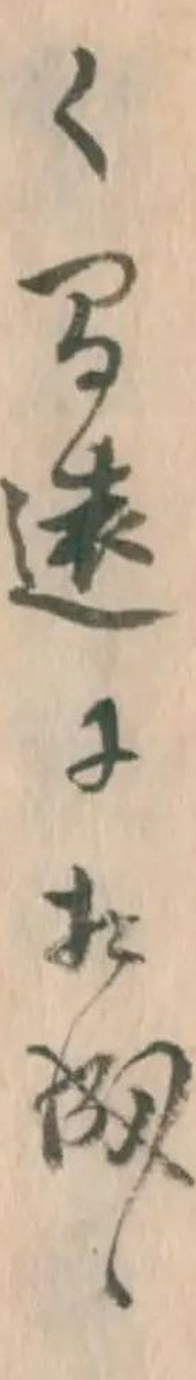く間遠に相成候
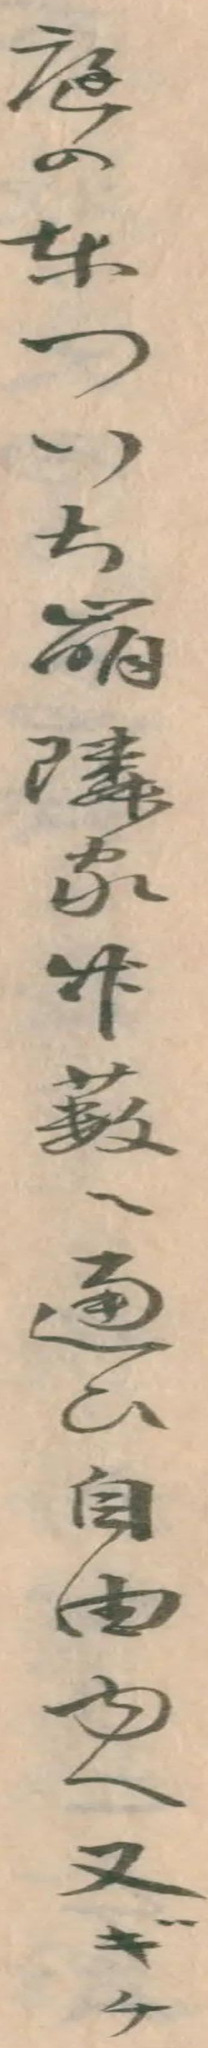庭の東ついち崩隣家竹藪へ通ひ自由ゆへ又ギチ
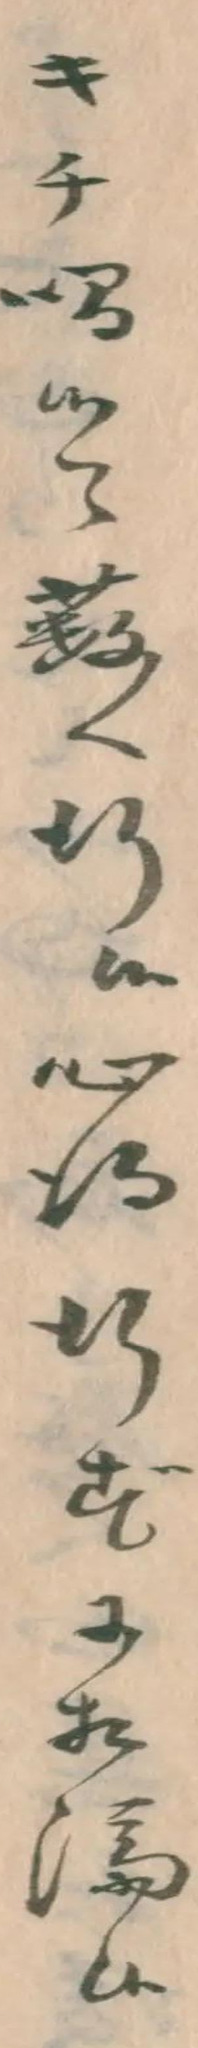キチ鳴候ハゝ藪へ折候心持折ずに相滴候
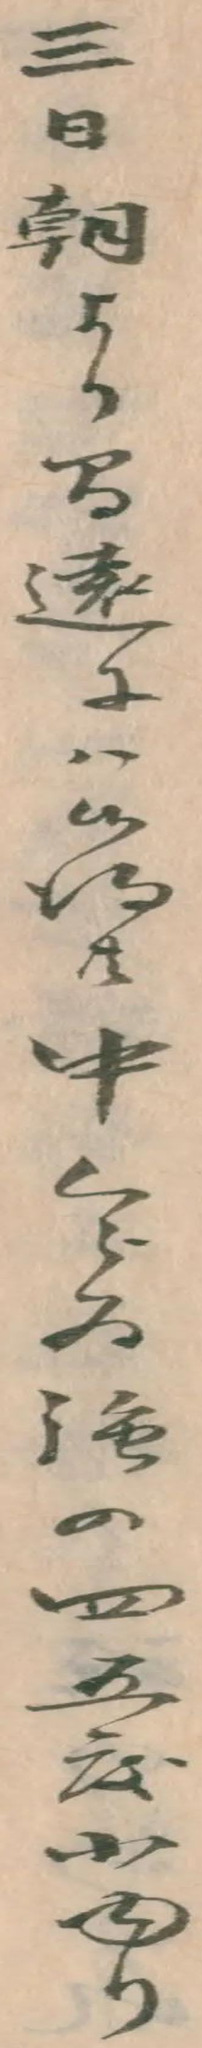三日朝より間遠にハ候得共中くらゐ強の四五度小ゆり
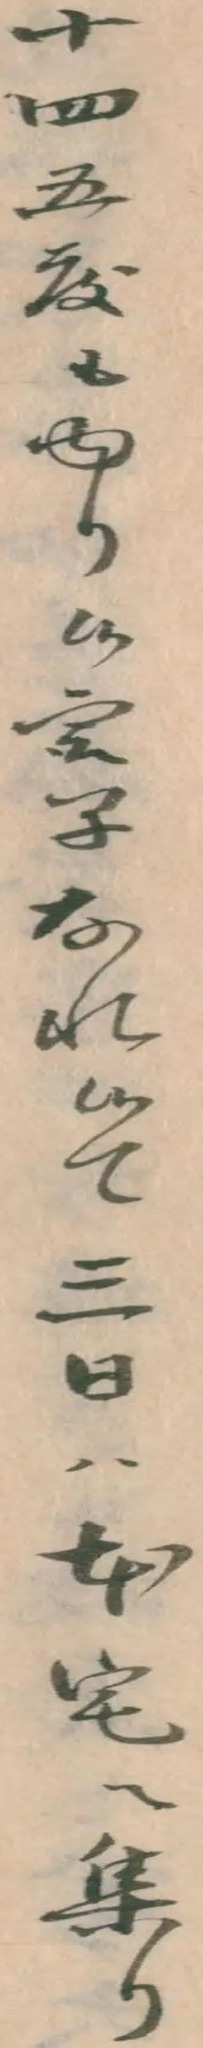十四五度もゆり候最早なれ候て三日は本宅へ集り
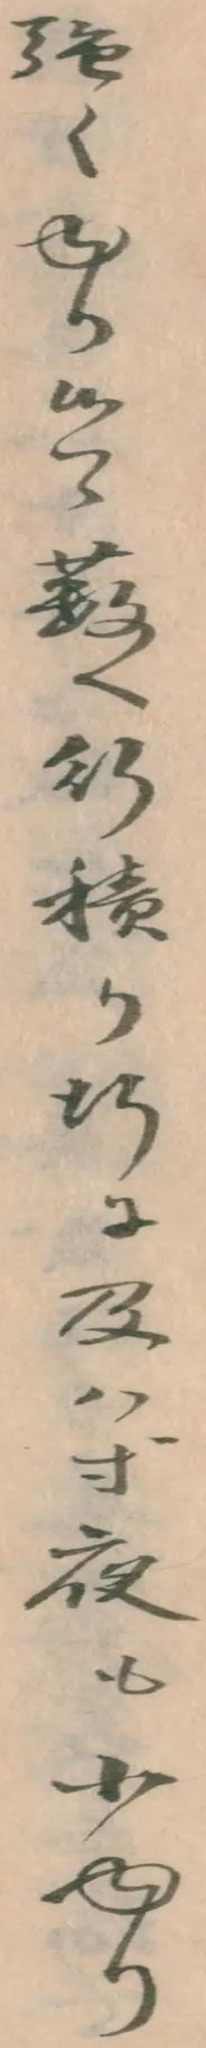強くなり候ハゝ藪へ行積りに及ハす夜も小ゆり
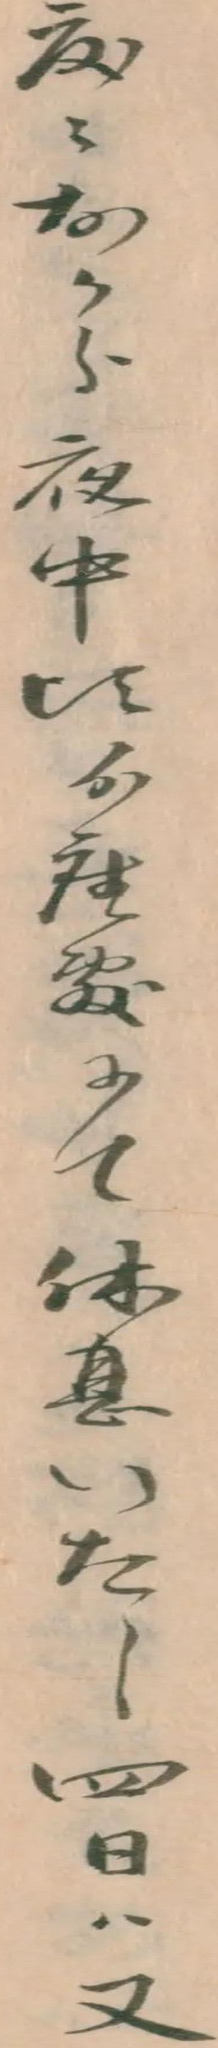度々なから夜中頃ゟ座敷にて休息いたし四日ハ又
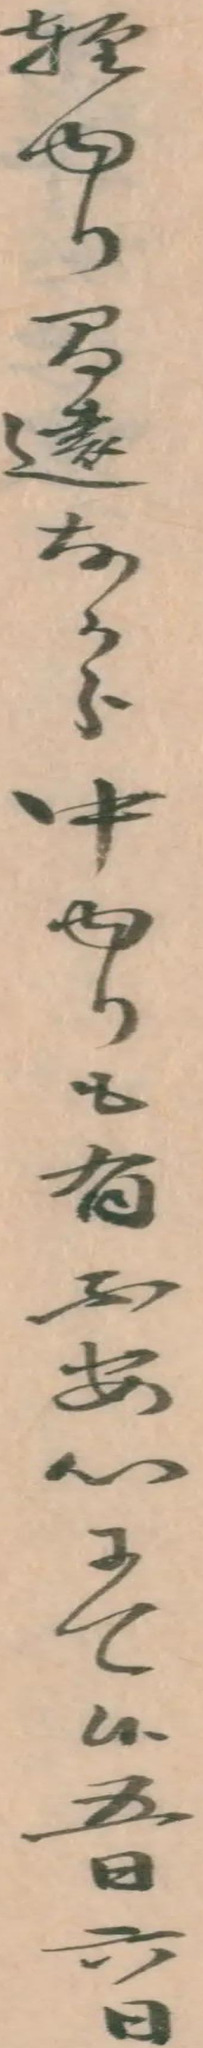軽ゆり間遠なから中ゆりも有不安心にて候五日六日
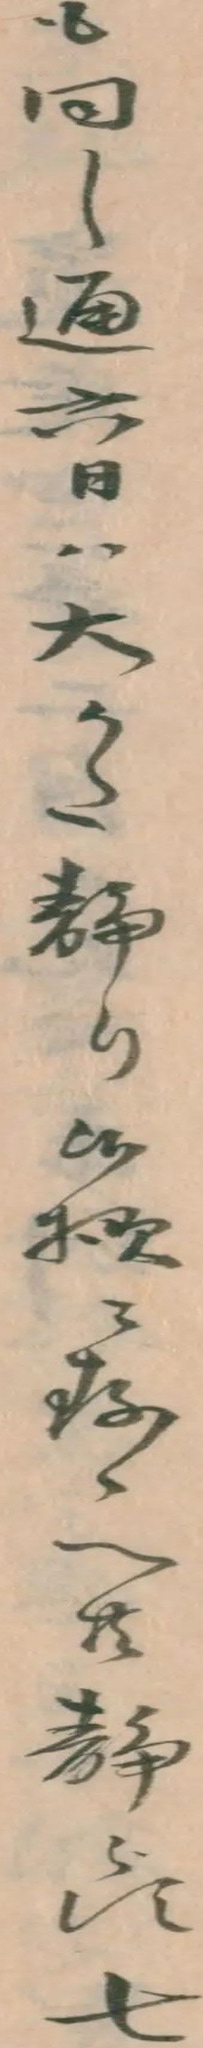も同し通六日は大かた静り候様二存候へ共静らす七
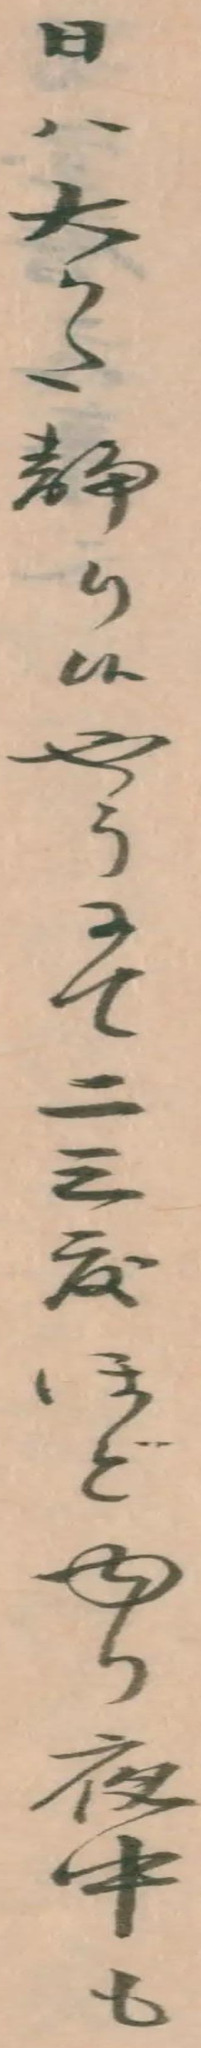日は大方静り候やうにて二三度ほとゆり夜中も
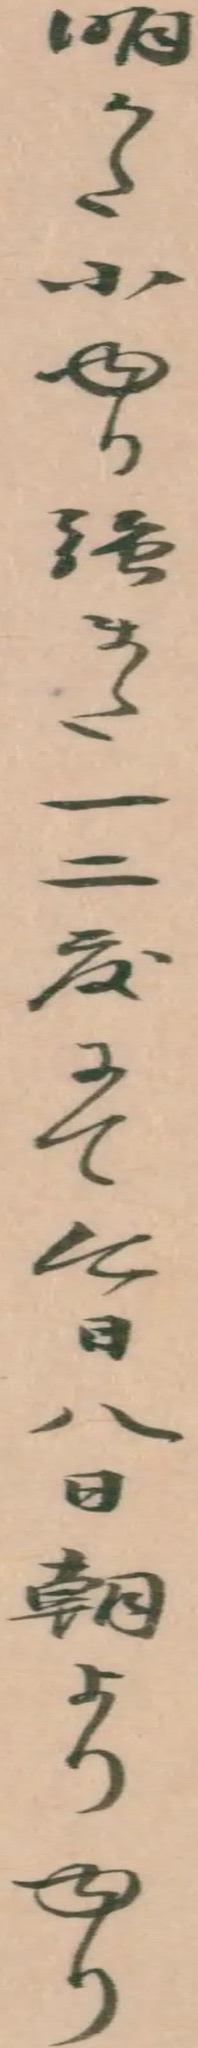明かた小ゆり強また一二度にて今日八日朝よりゆり
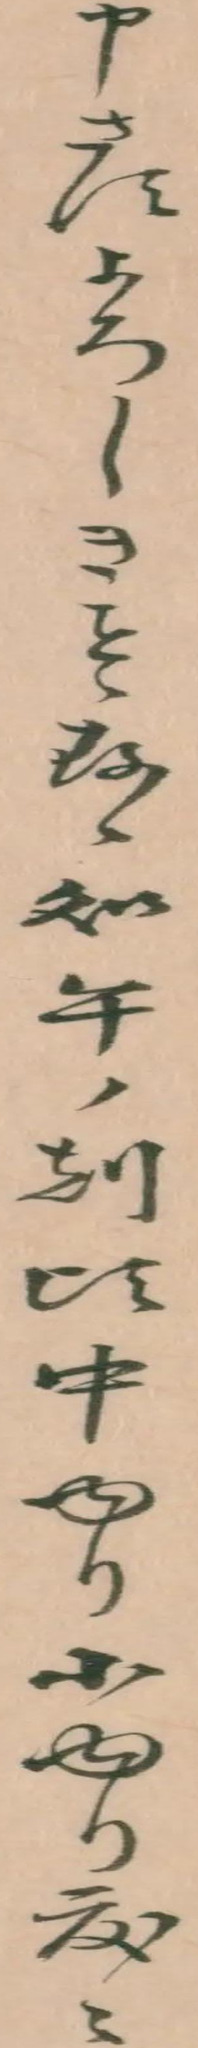申さすよろしきこと存候処午ノ刻頃中ゆり小ゆり度々
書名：京都地震
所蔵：国立国会図書館 National Diet Library, JAPAN
